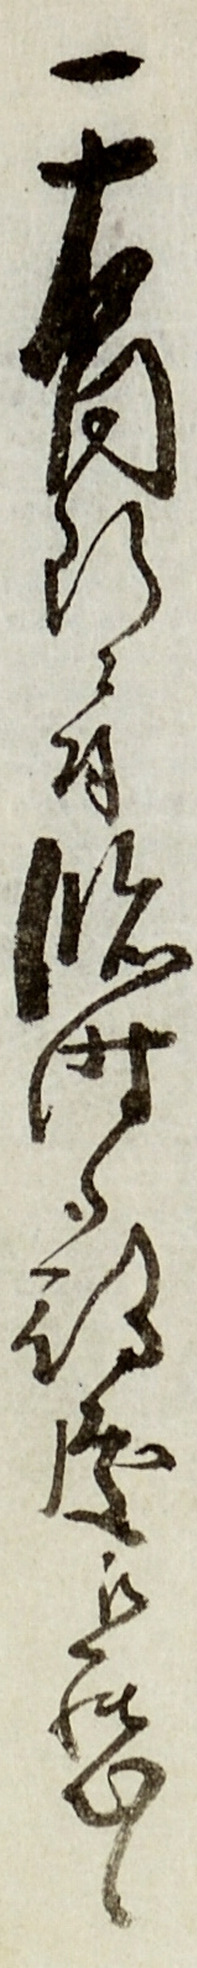一右同断ニ付臨時御役処江罷出候
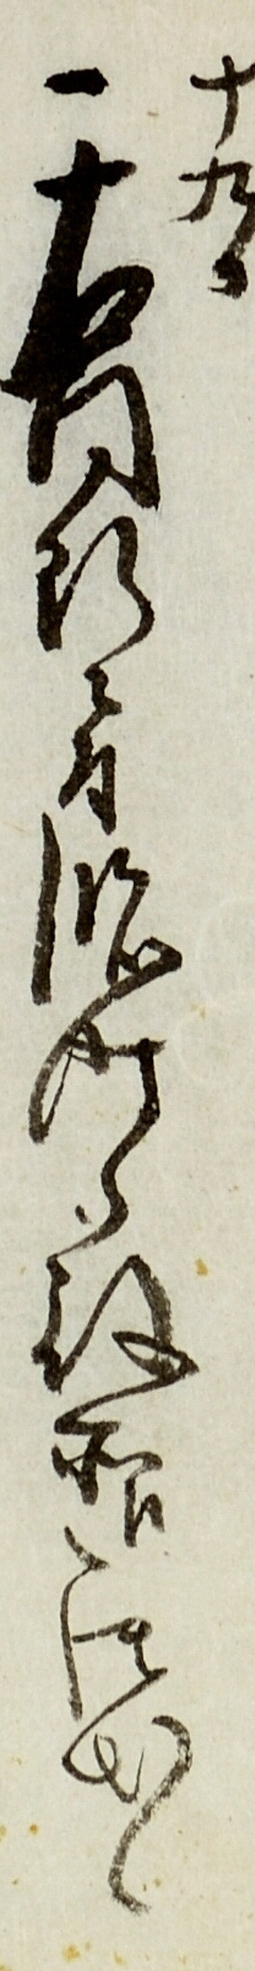一右同断ニ付臨時御役所江罷出候
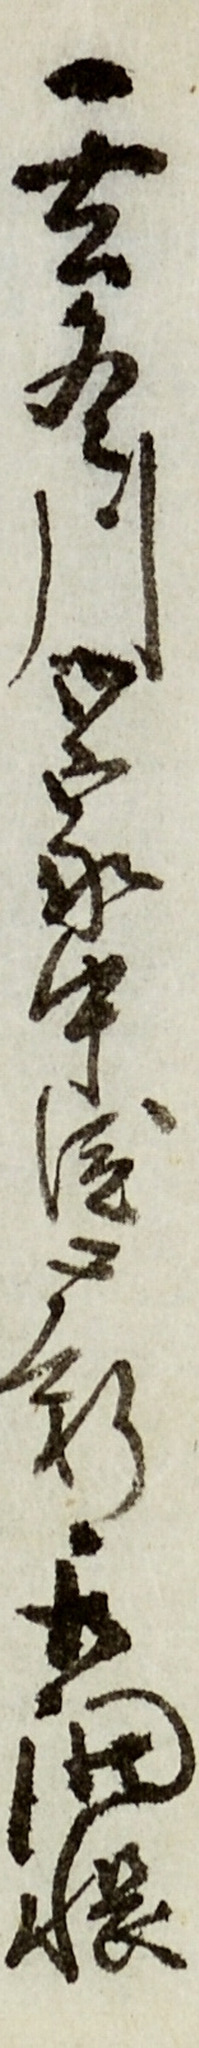一去冬川御家中渡薪取調帳
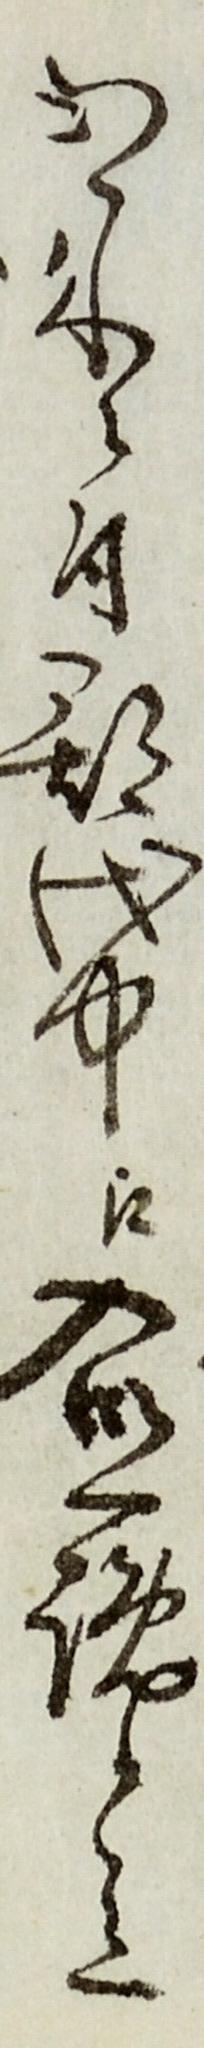出来ニ付郡代中江入御一覧候上
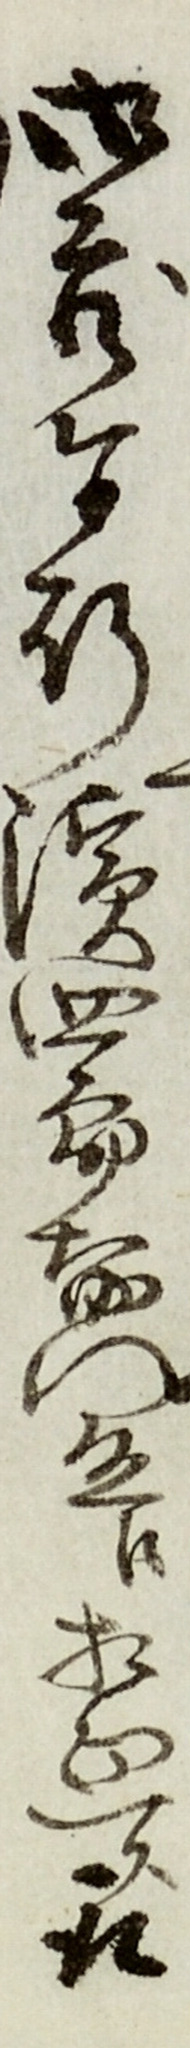御蔵奉行浜四郎右衛門殿江相廻ス取
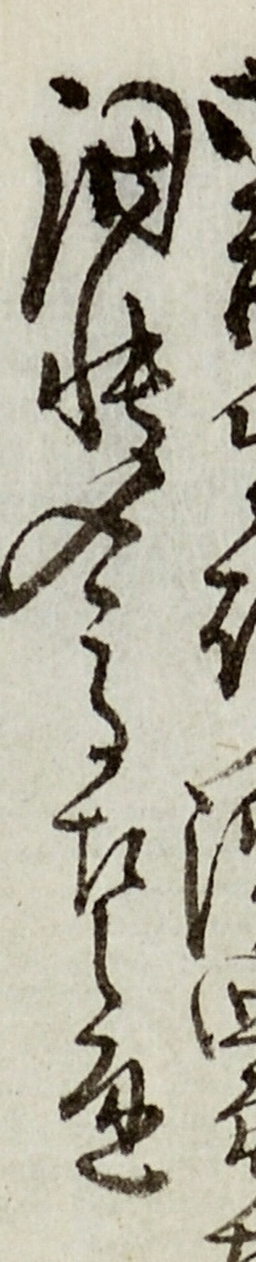調帳〆候事左之通
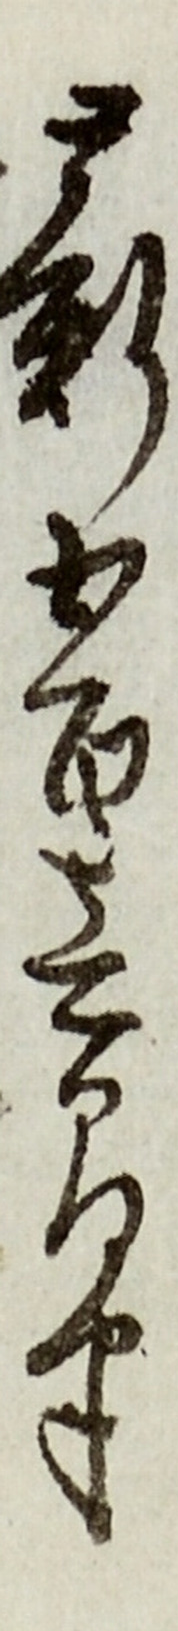薪五百壱間半
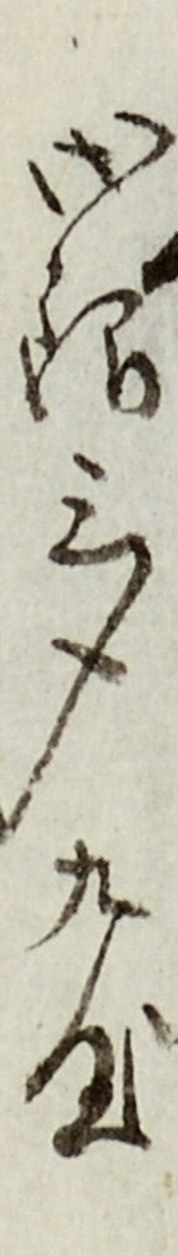代銀三貫九匁
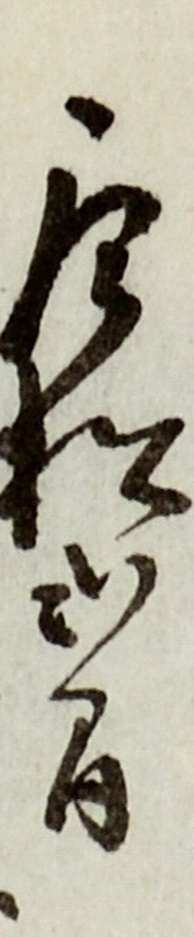唐松弐間
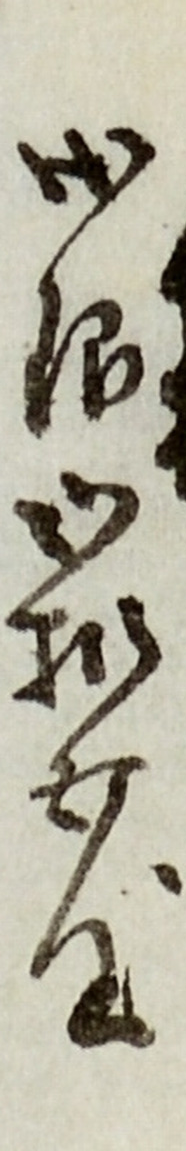代銀弐拾五匁
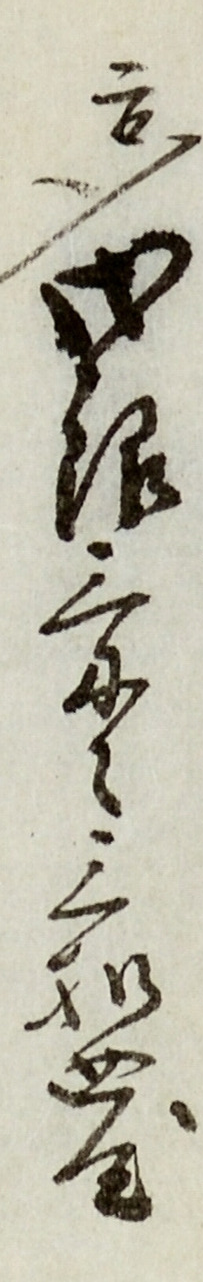〆代銀三貫三拾四匁
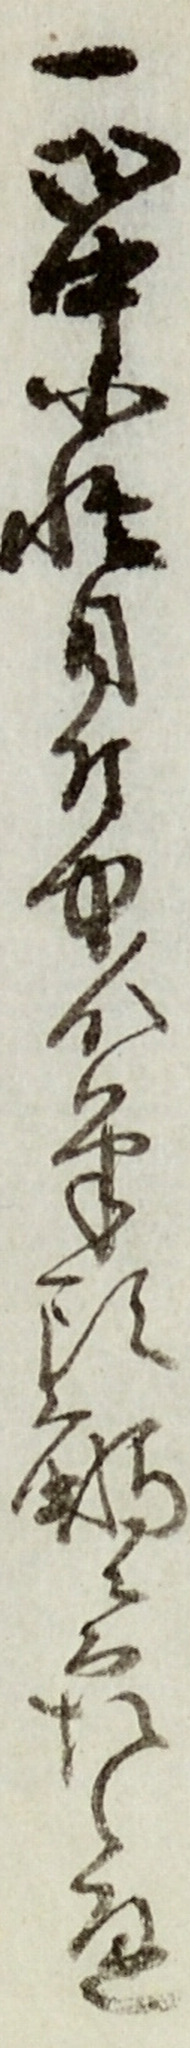一御中小性目付中ゟ筆頭触ニ而左之通
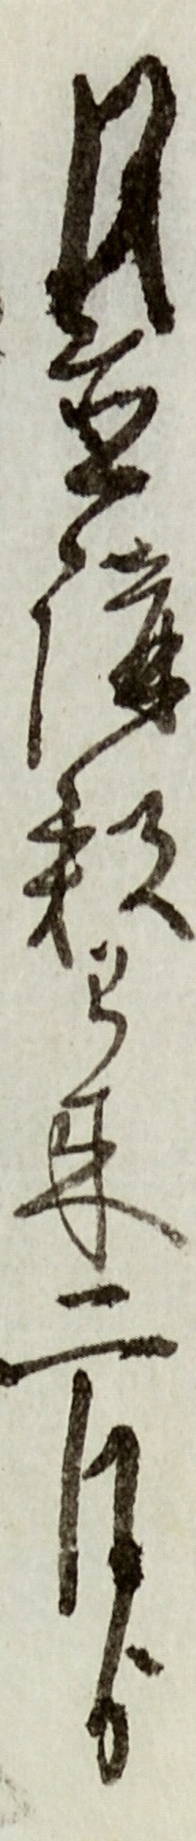月並講釈已来二月ゟ
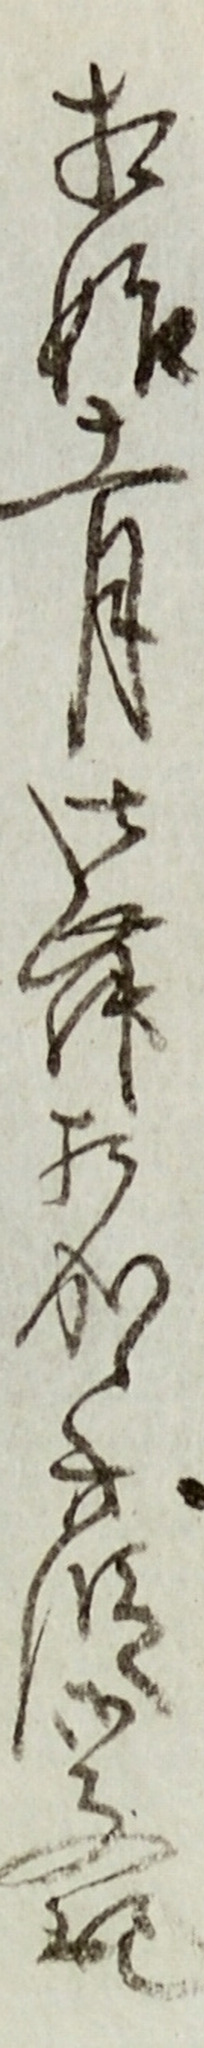相始十一月仕舞相成候其段御支配
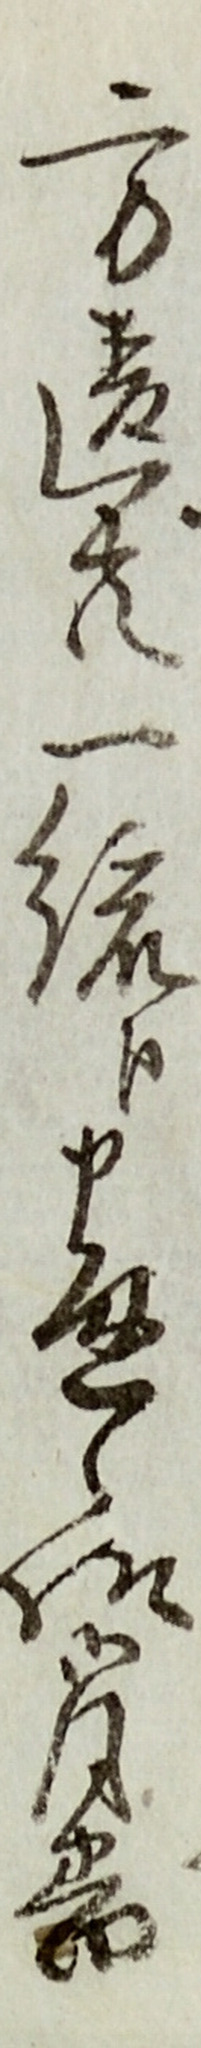方違共一統江申通候様御月番

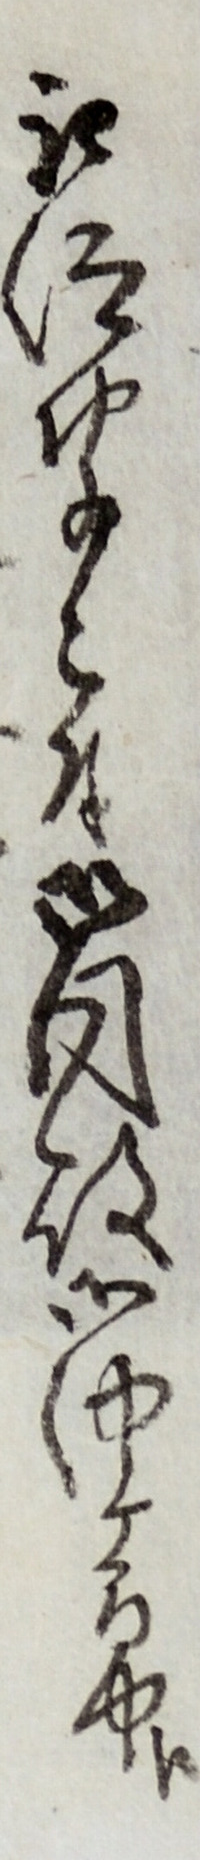被仰聞候付御同役御仲ケ間中江
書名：御山方御薪方諸事御用留
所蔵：伊那市立高遠町図書館・合同会社AMANE
